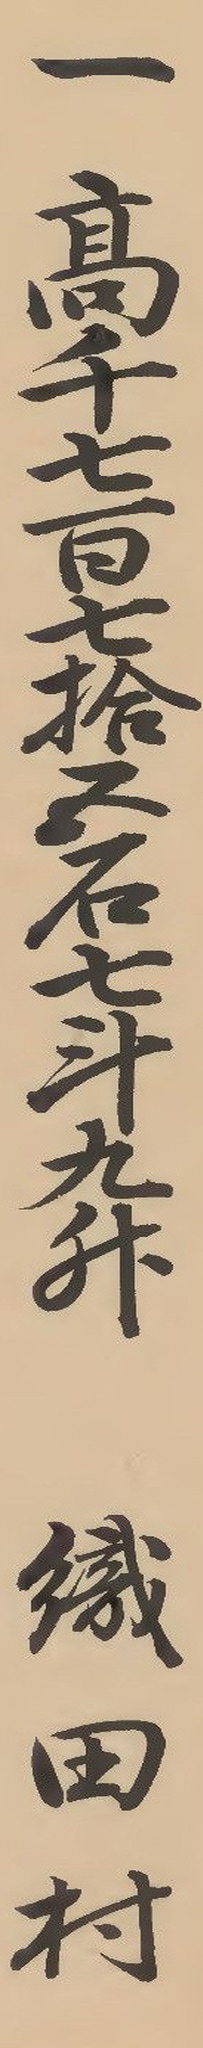一高千七百七拾五石七斗九升織田村
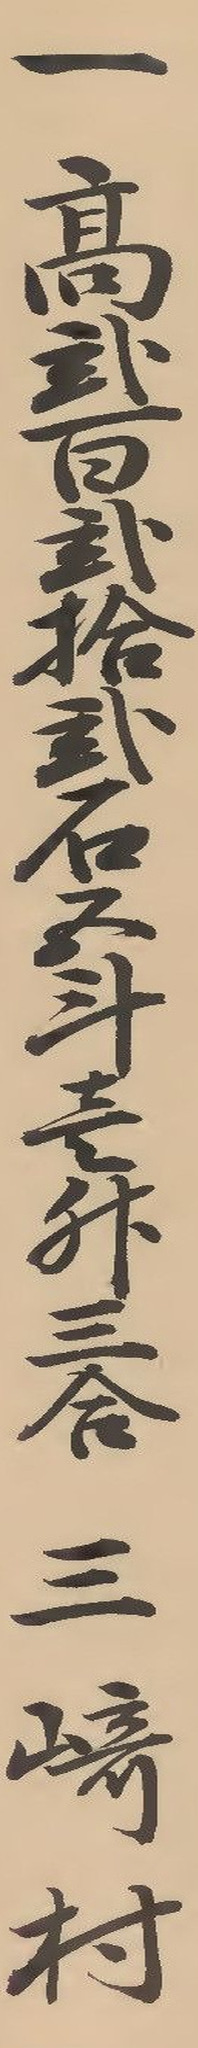一高弐百弐拾弐石五斗壱升三合三崎村
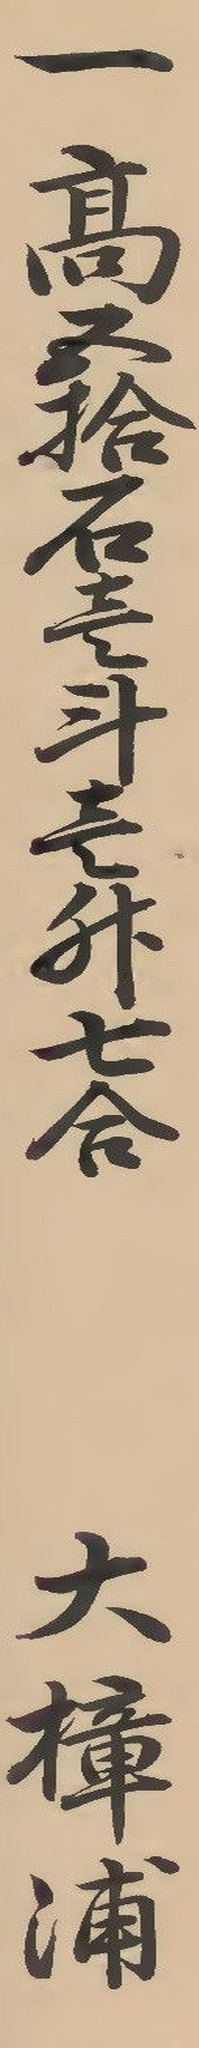一高五拾石壱斗壱升七合大樟浦
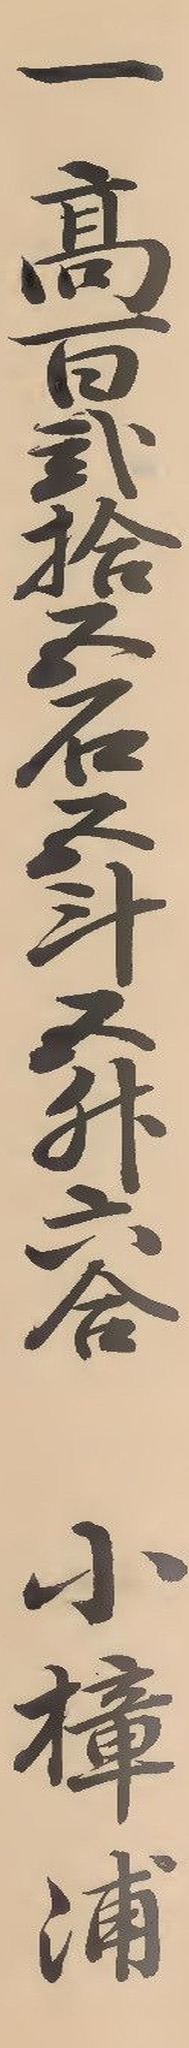一高百弐拾五石五斗五升六合小樟浦
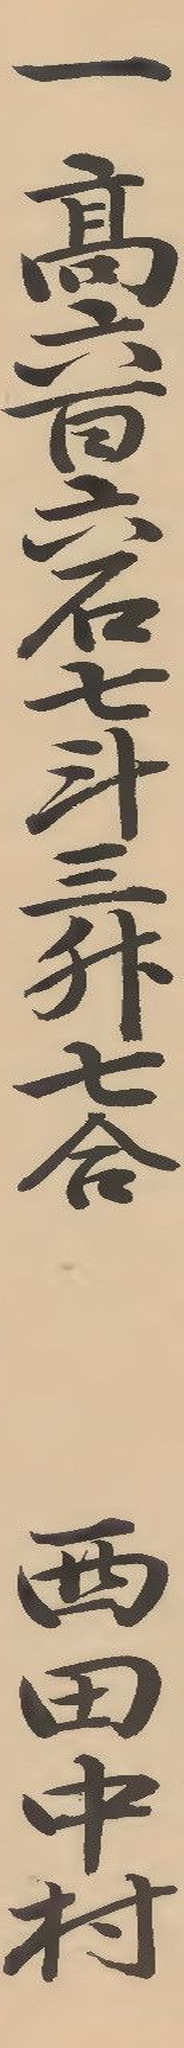一高六百六石七斗三升七合西田中村
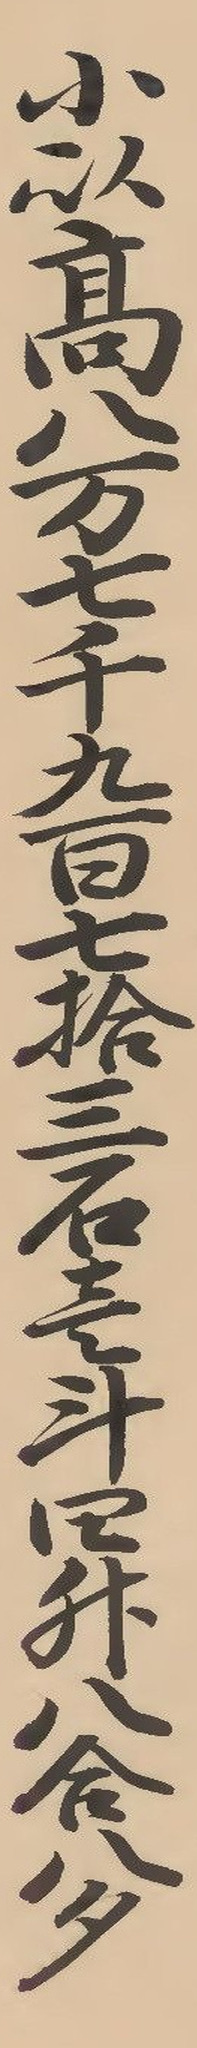小以高八万七千九百七拾三石壱斗四升八合八勺

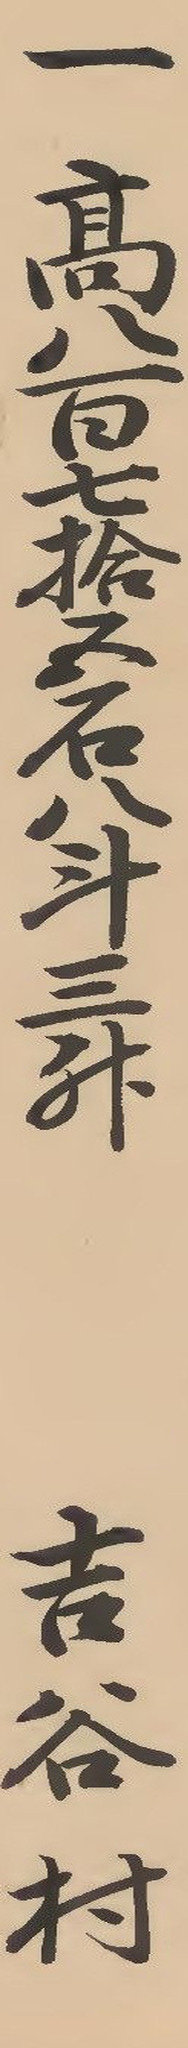一高八百七拾五石八斗三升吉谷村
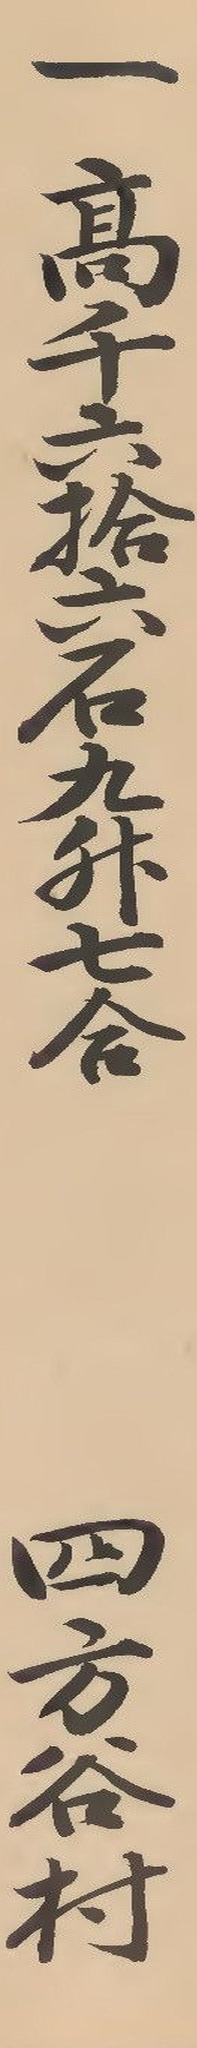一高千六拾六石九升七合四方谷村
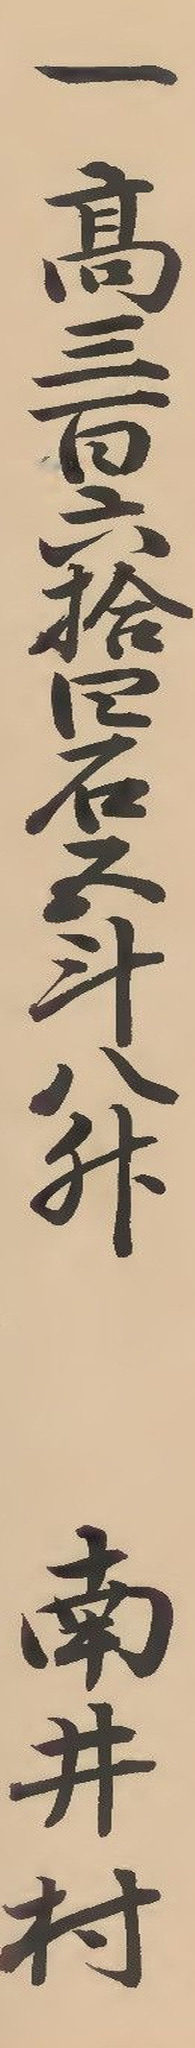一高三百六拾四石五斗八升南井村
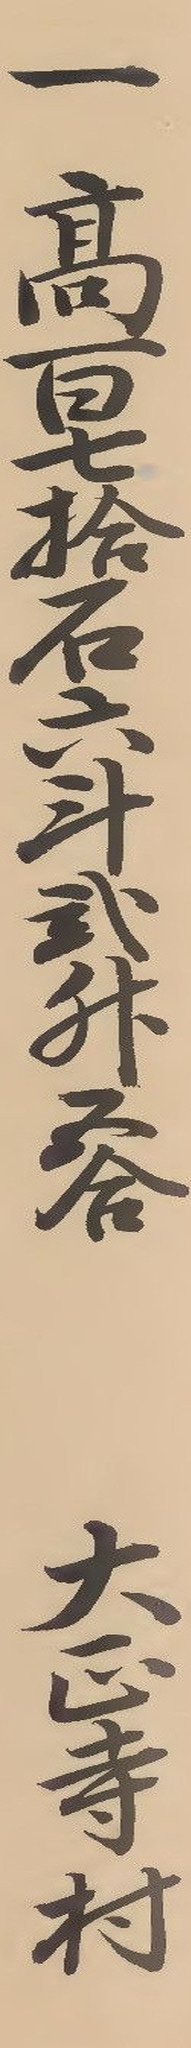一高百七拾石六斗弐升五合大正寺村
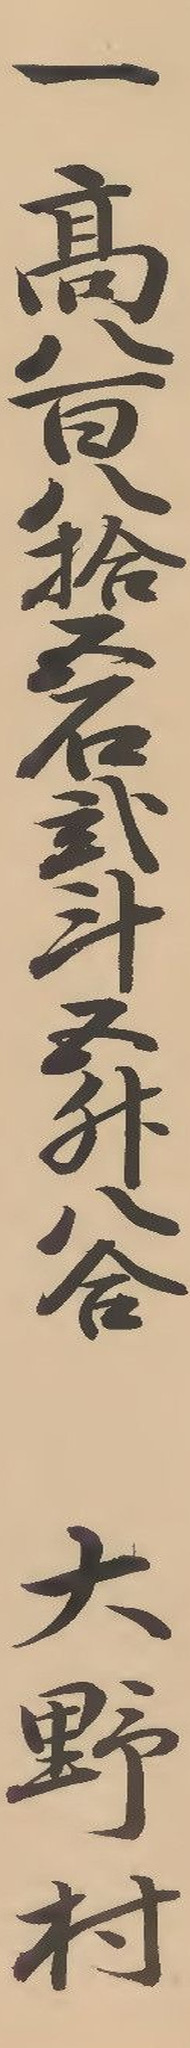一高八百八拾五石弐斗五升八合大野村
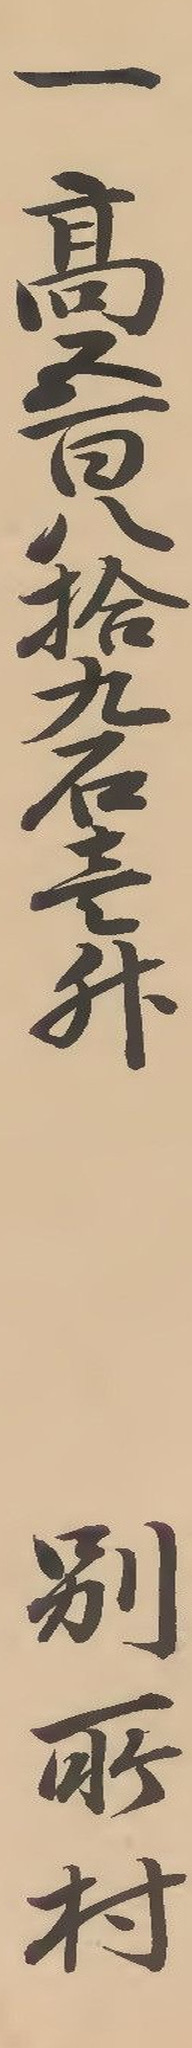一高五百八拾九石壱升別所村
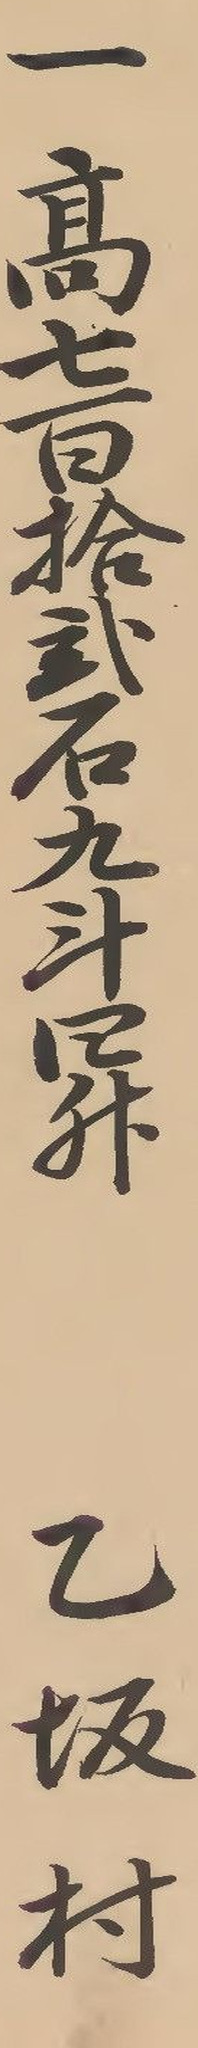一高七百拾弐石九斗四升乙坂村

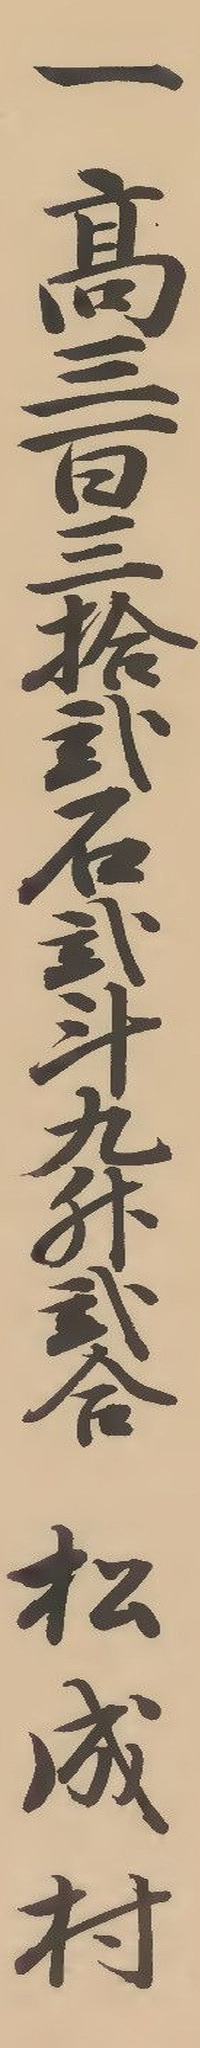一高三百三拾弐石弐斗九升弐合松成村
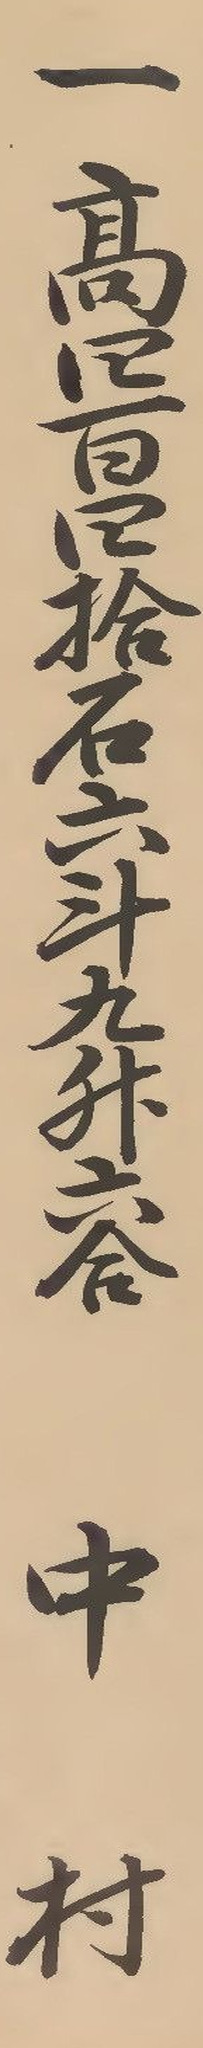一高四百四拾石六斗九升六合中村
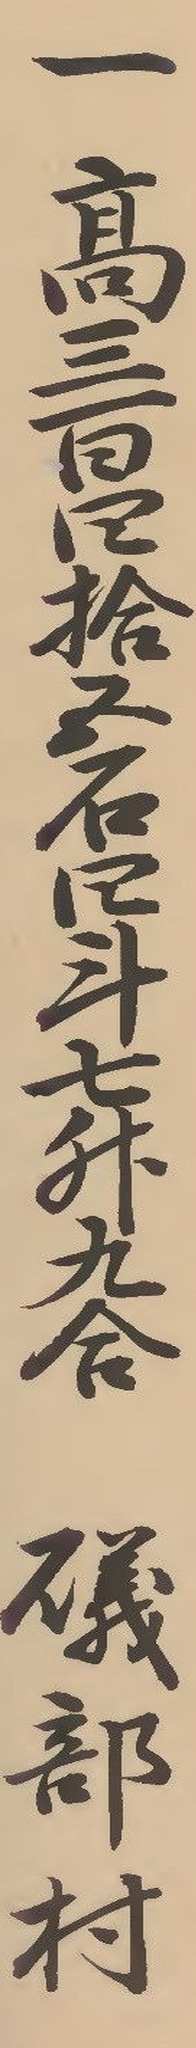一高三百四拾五石四斗七升九合礒部村
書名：越前国郷帳
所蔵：国立公文書館 National Archives of Japan
